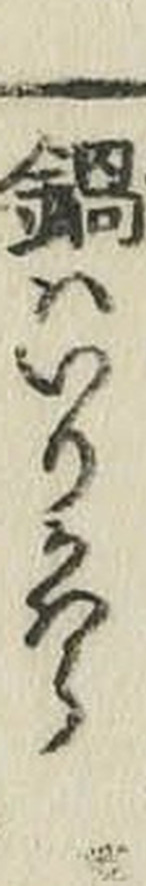鍋はいりかはら
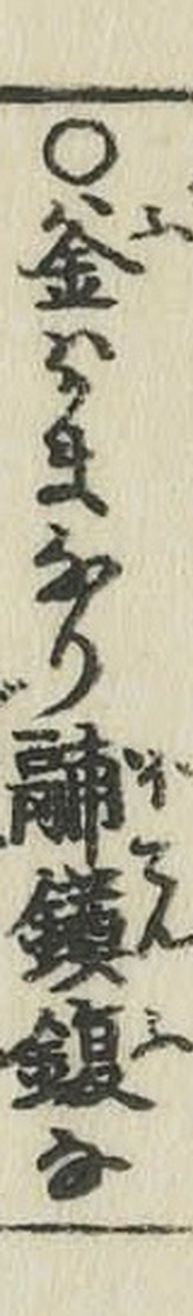○釜はかまなり鬴▢鍑な
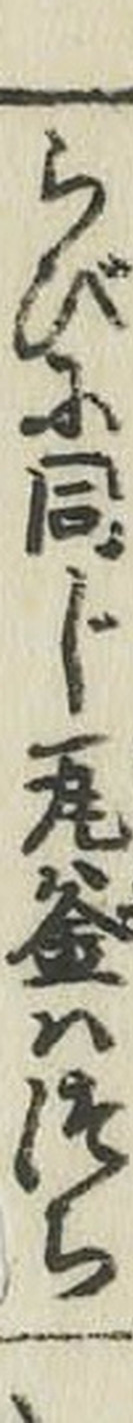らびに同じ瓦釜はつち
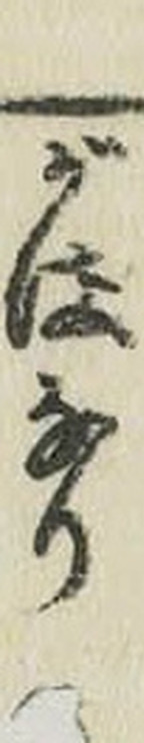がまなり
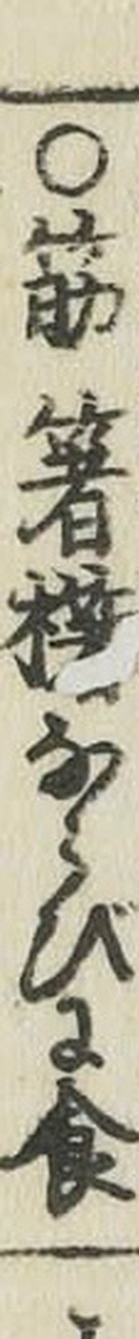○筯箸櫡ならびに食
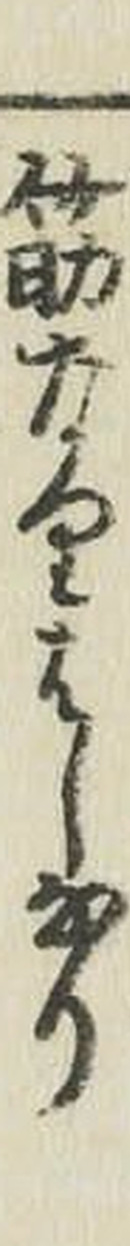筯なりはしなり
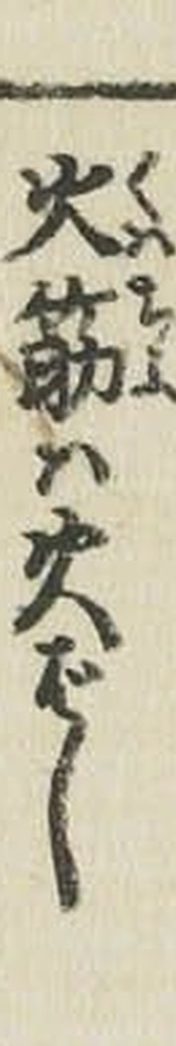火筯は火ばし
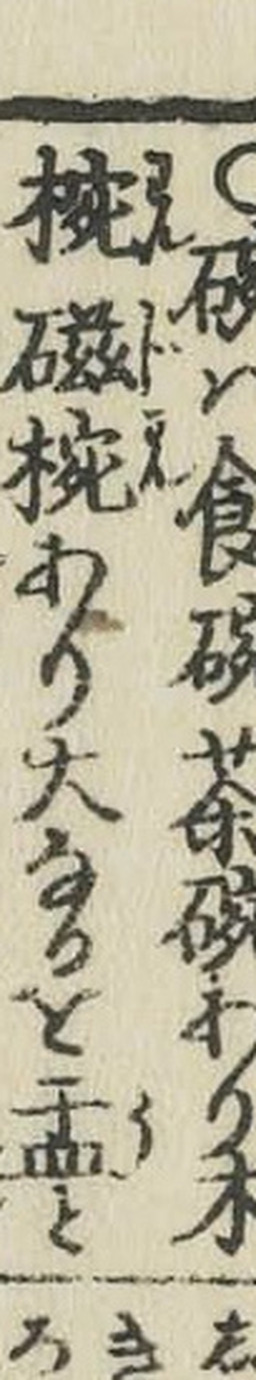椀磁椀あり大なるを盂と
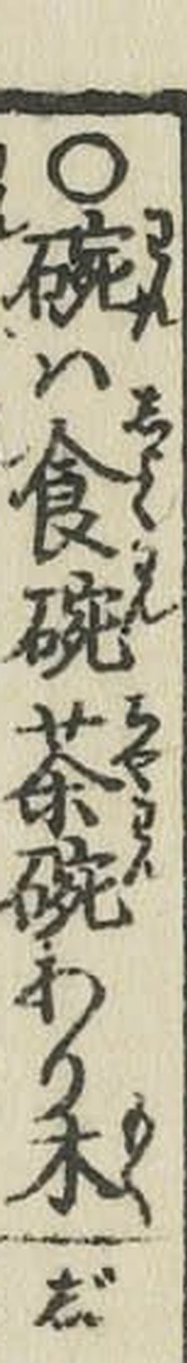○碗は食碗茶碗あり木
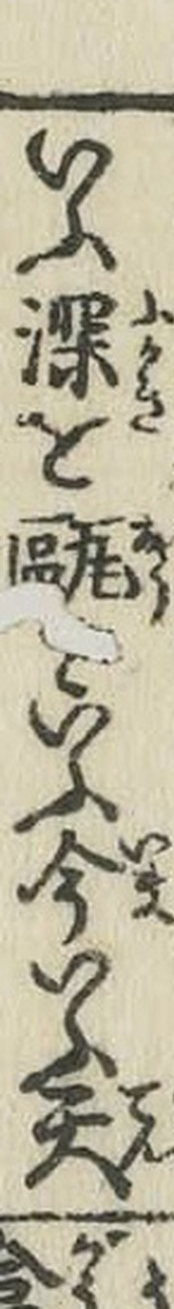いふ深を甌といふ今いふ天
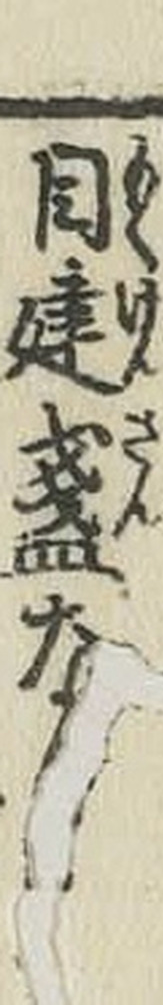目建盞な▢
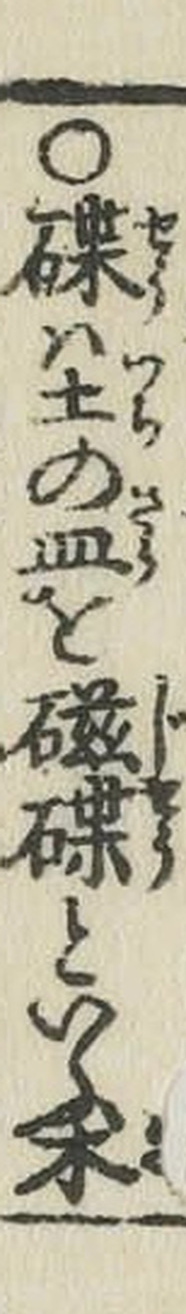○碟は土の皿を磁碟といふ木
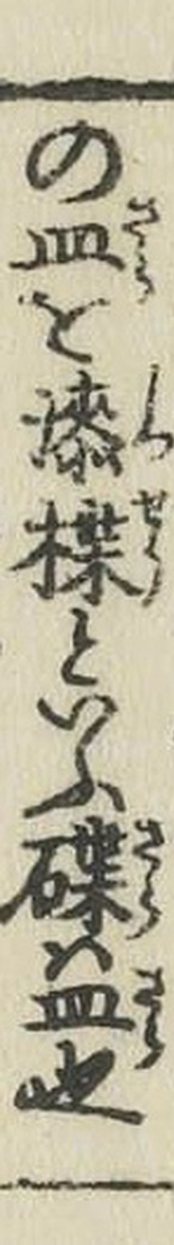の皿を漆楪といふ碟は皿也
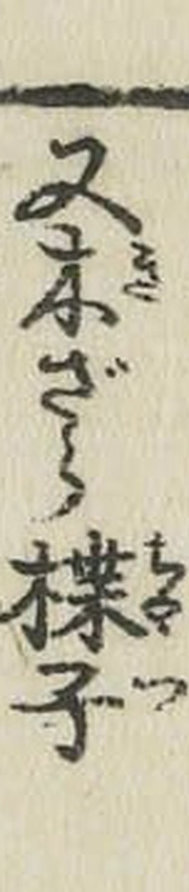又木ざら楪子
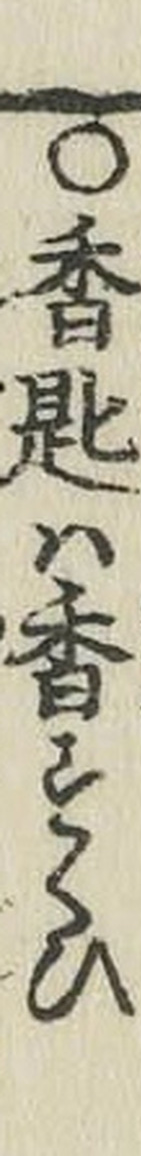○香匙は香すくひ
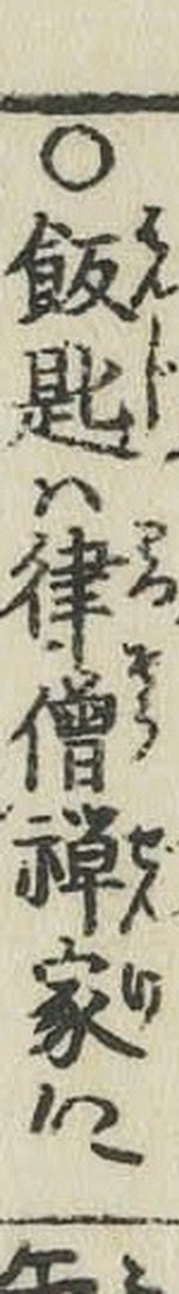○飯匙は律僧禅家に
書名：増補頭書訓蒙図彙大成 10巻 5:巻之9-11
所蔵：東京学芸大学教育コンテンツアーカイブ
